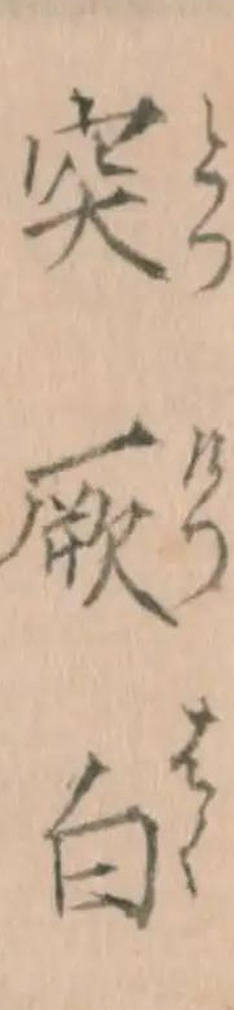突厥白

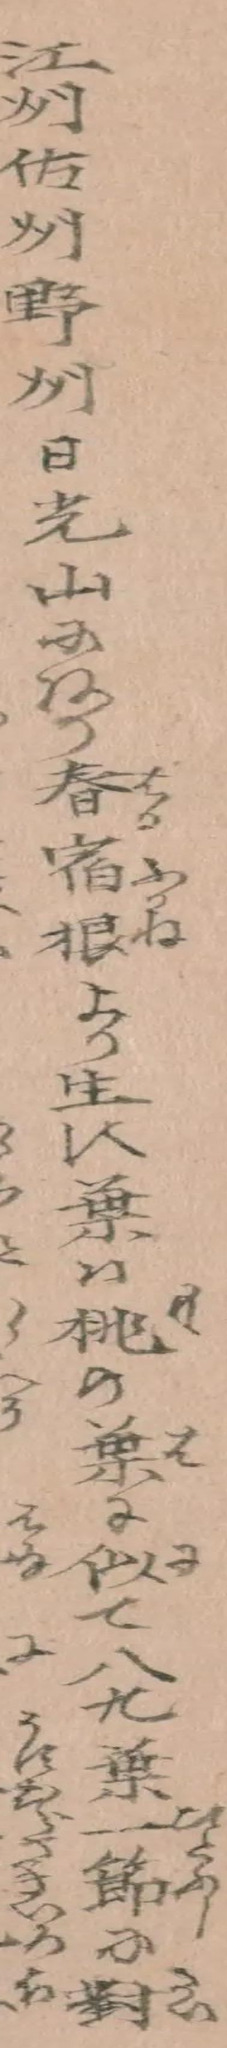江州佐州野州日光山にあり春宿根より生す葉は桃の葉に似て八九葉一節に対
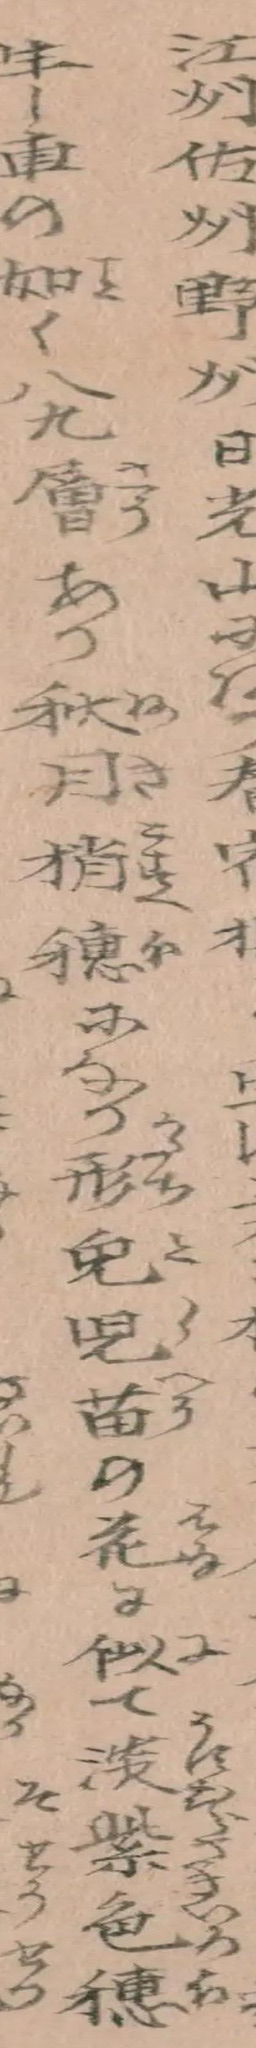生し車の如く八九層あり秋月梢穂になり形兎児苗の花に似て淡紫色穂
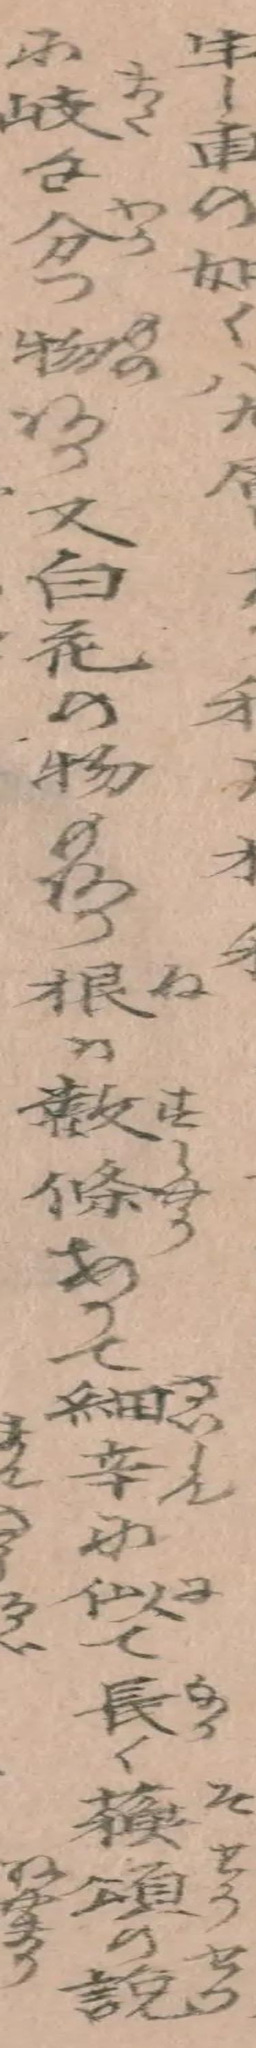に岐を分つ物あり又白花の物もあり根は数条ありて細辛に似て長く蘇頌の説
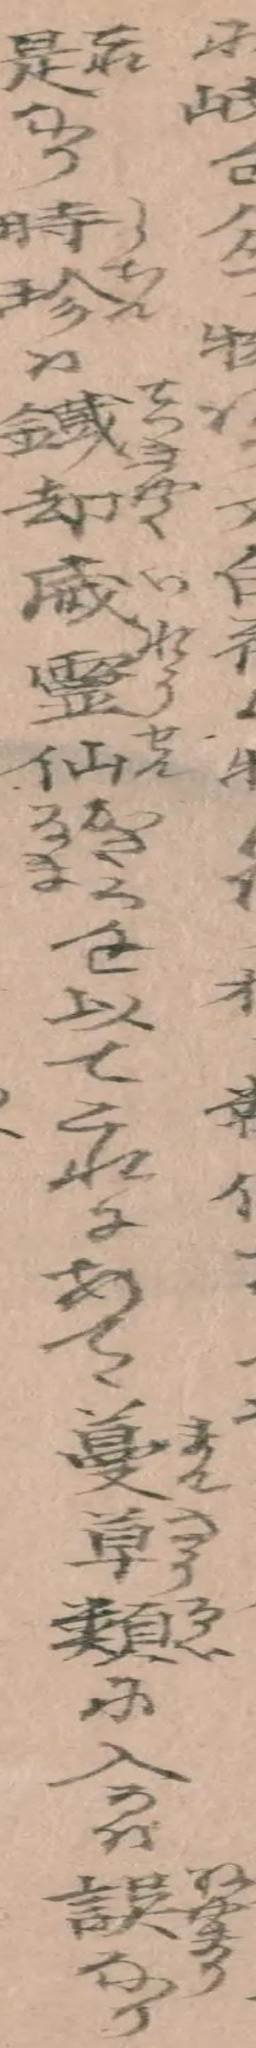是なり時珍は鉄却威霊仙かさくるまを以てこれにあてゝ蔓草類に入るは誤なり
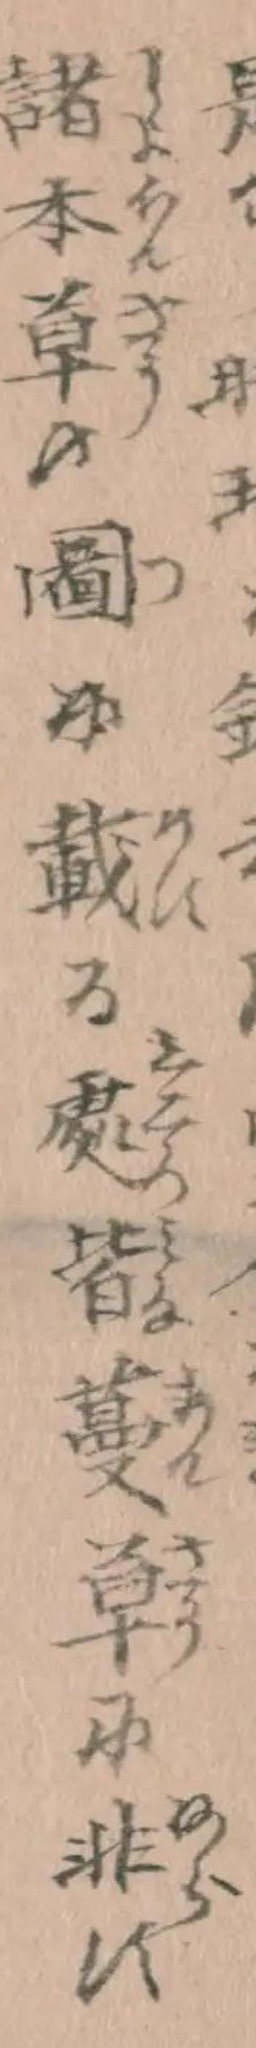諸本草の図に載る処皆蔓草に非す
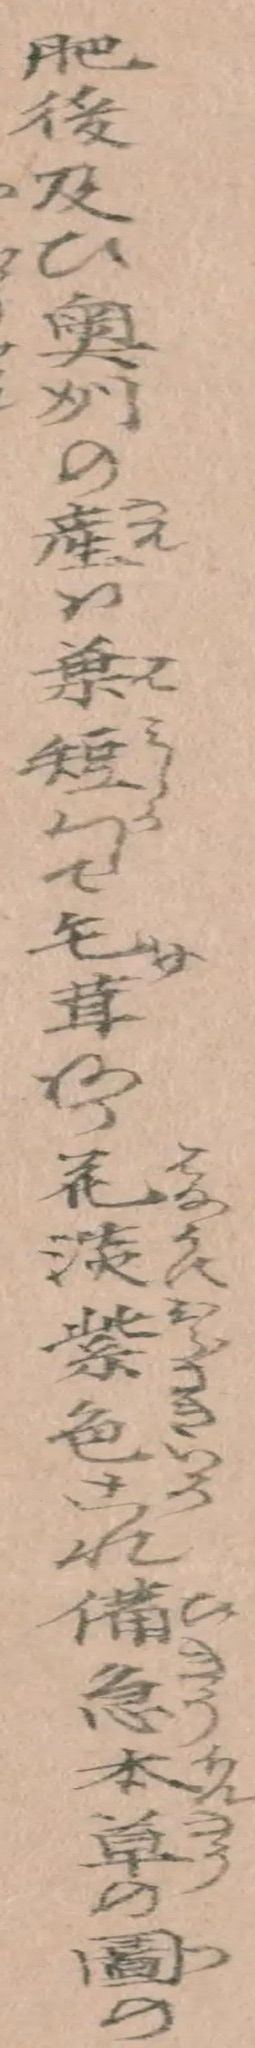肥後及ひ奥州の産は葉短くして毛茸あり花淡紫色これ備急本草の図の
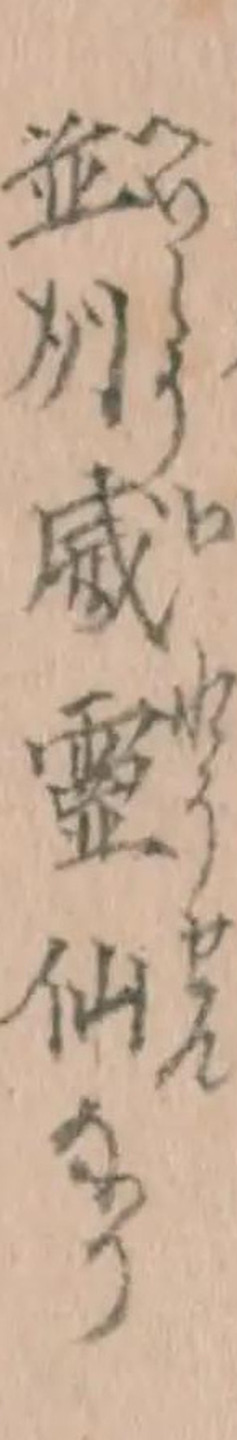並州威霊仙なり

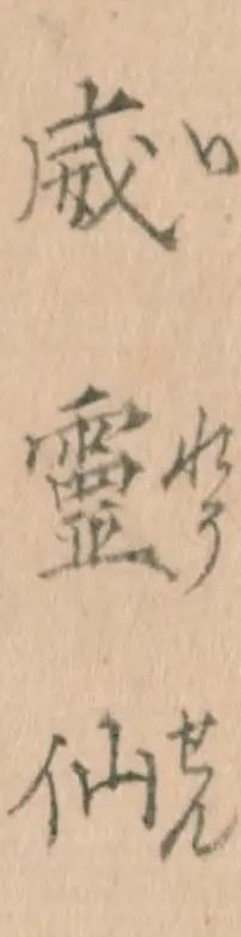威霊仙

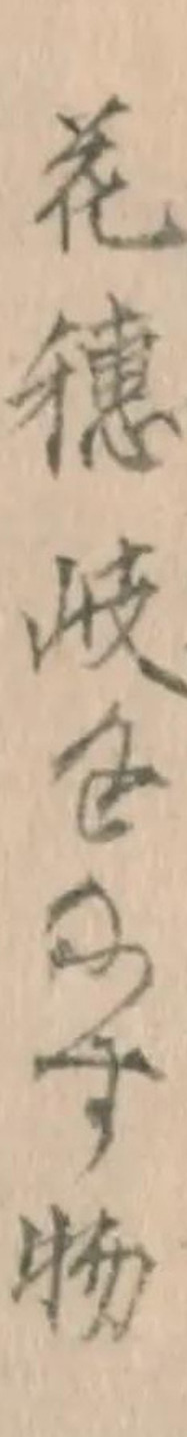花穂岐をなす物
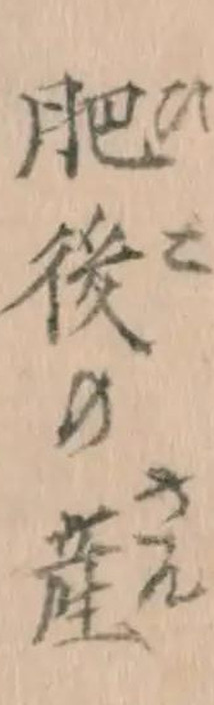肥後の産

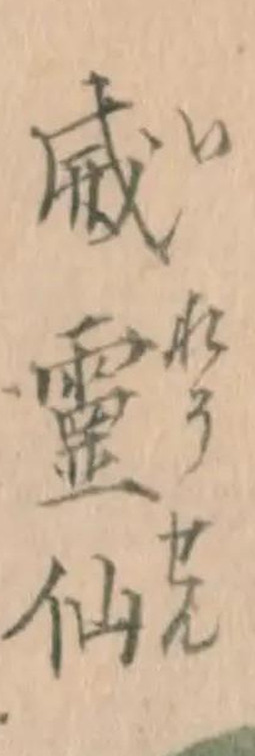威霊仙
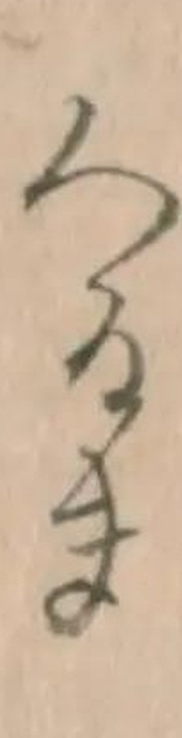くるま
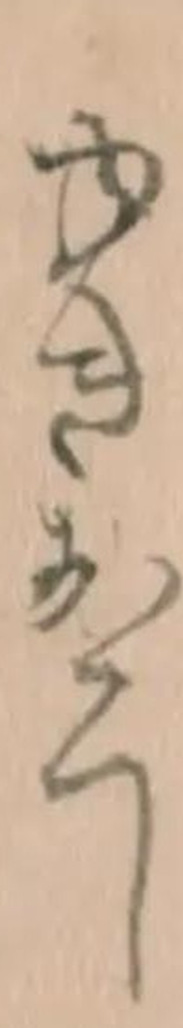ゆきおこし

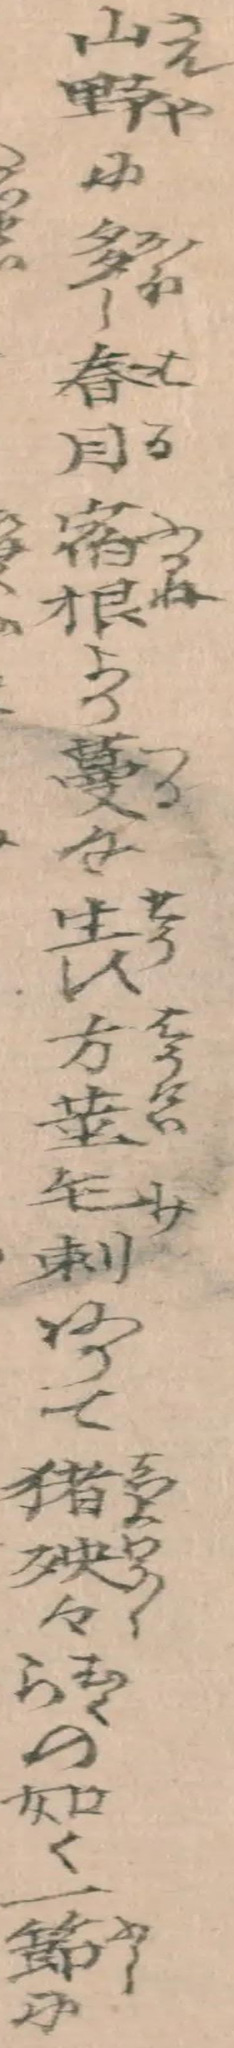山野に多し春月宿根より蔓を生す方茎毛剌ありて猪殃々むくらの如く一節に
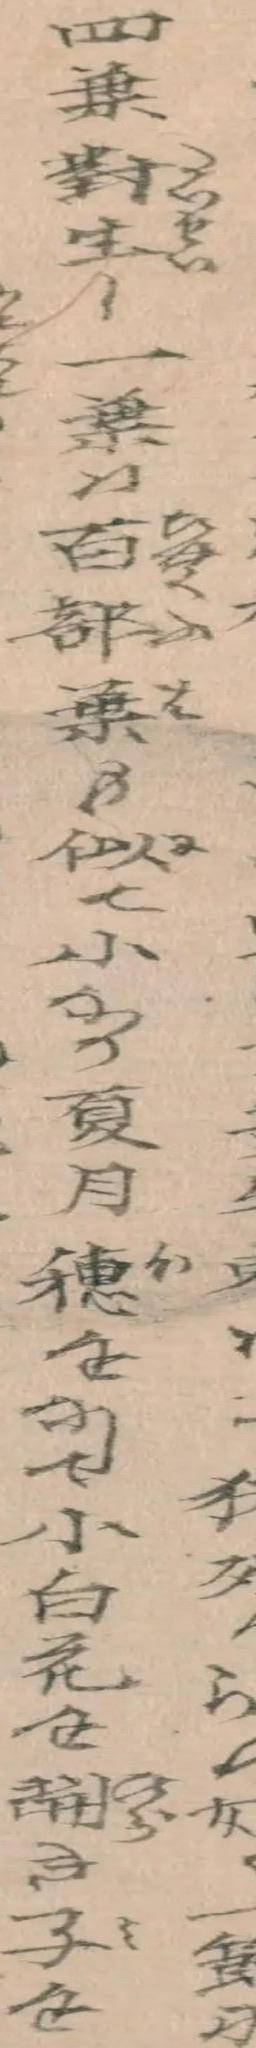四葉対生し一葉は百部葉も似て小なり夏月穂をなして小白花を開き子を
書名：本草図譜. 巻28-30
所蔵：国立国会図書館 National Diet Library, JAPAN
